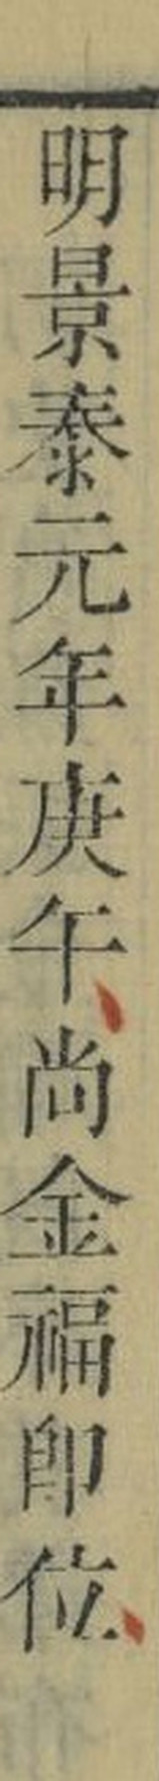明景泰元年庚午尚金福即位
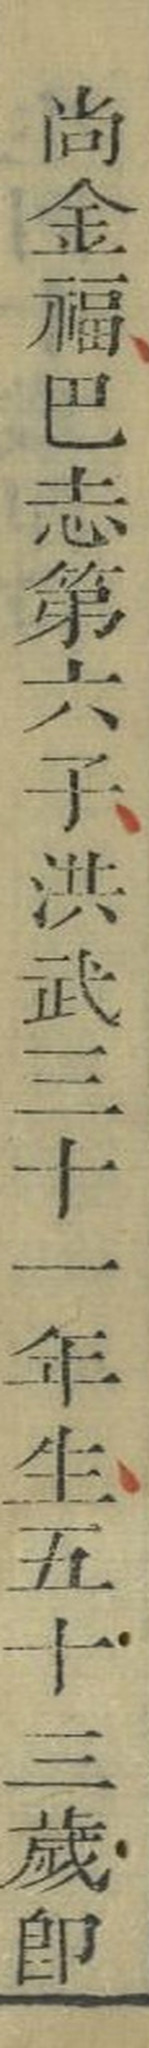尚金福巴志第六子洪武三十一年生五十三歳即
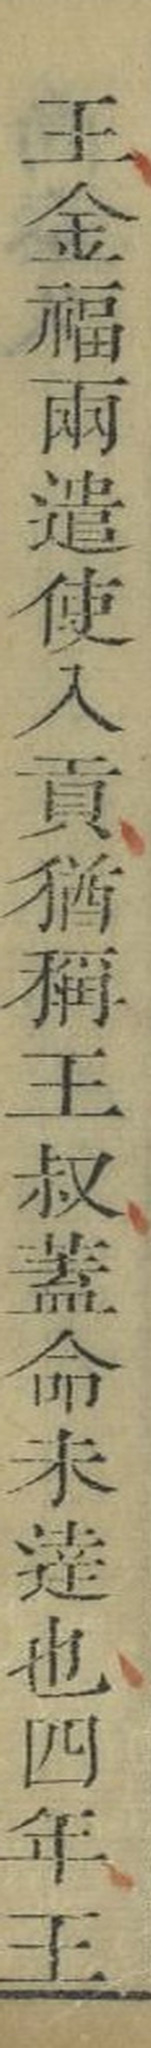王金福両遣使入貢猶称王叔蓋命未達也四年王
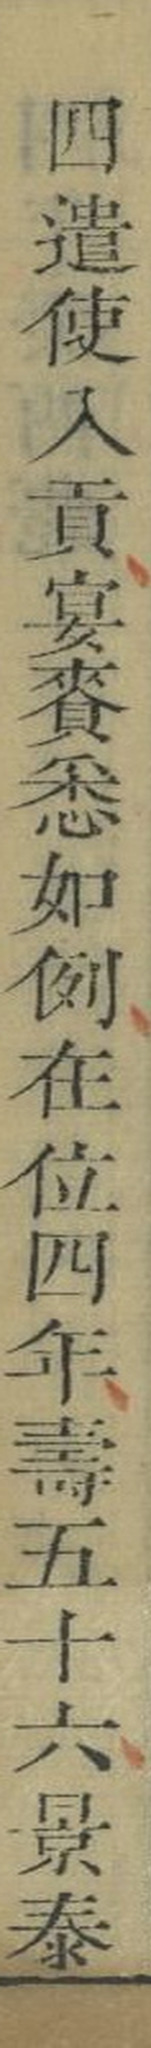四遣使入貢宴賚悉如例在位四年寿五十六景泰

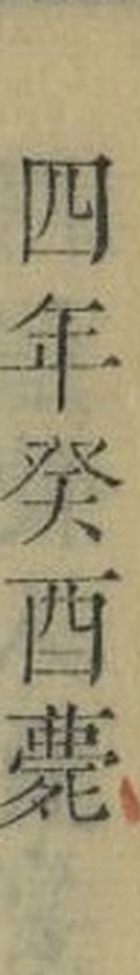四年癸酉薨
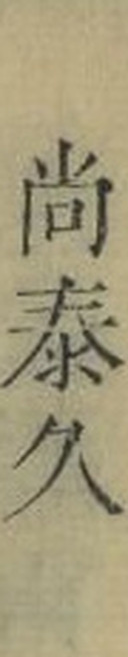尚泰久
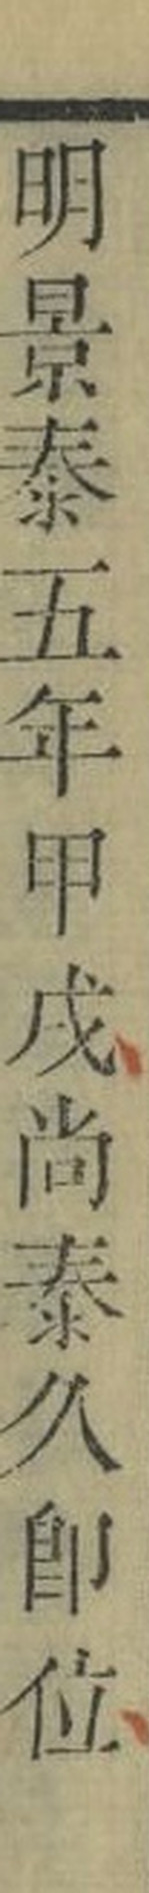明景泰五年甲戌尚泰久即位
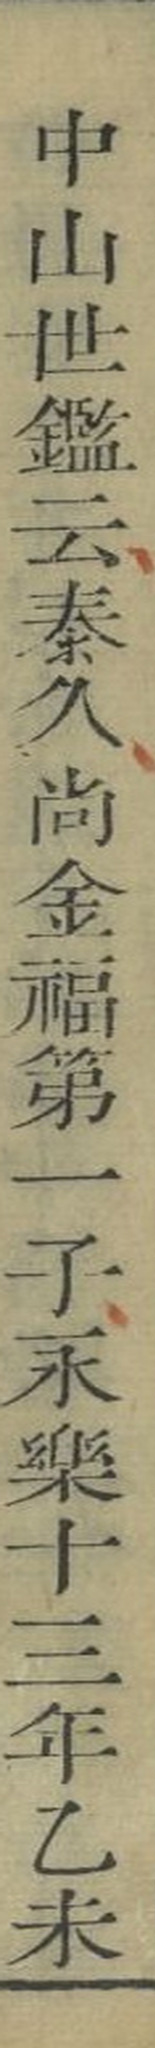中山世鑑云泰久尚金福第一子永楽十三年乙未
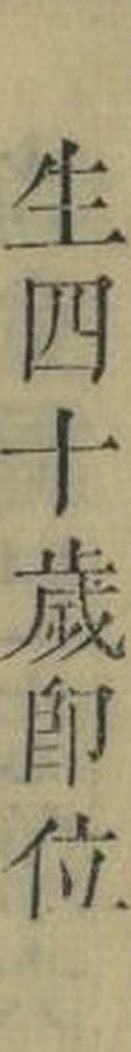生四十歳即位
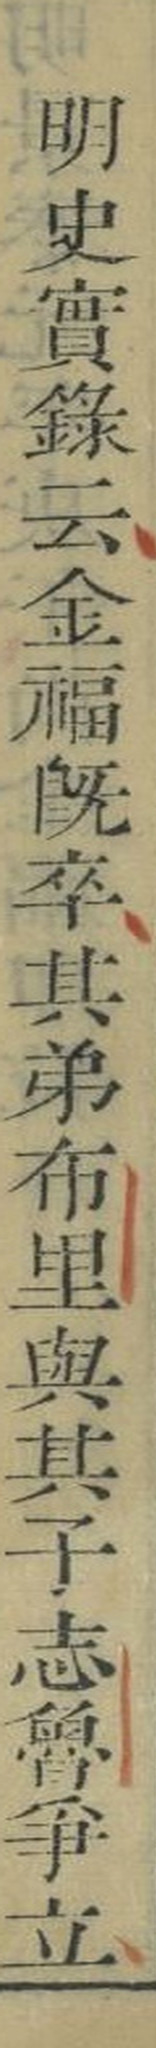明史実録云金福既卒其弟布里与其子志魯争立
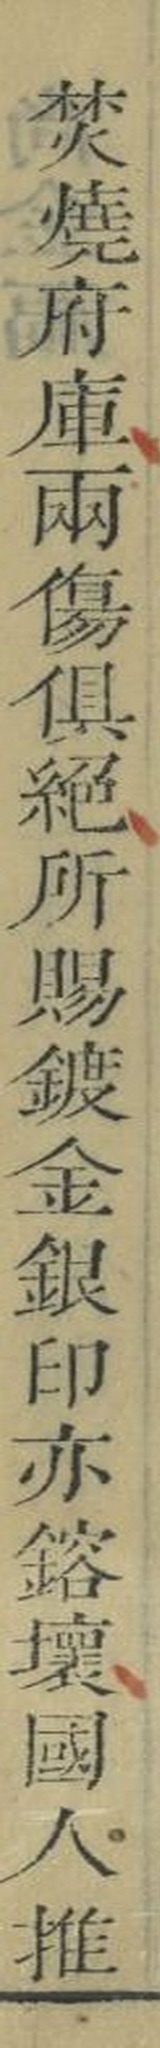焚焼府庫両傷俱絶所賜鍍金銀印亦鎔壊国人推
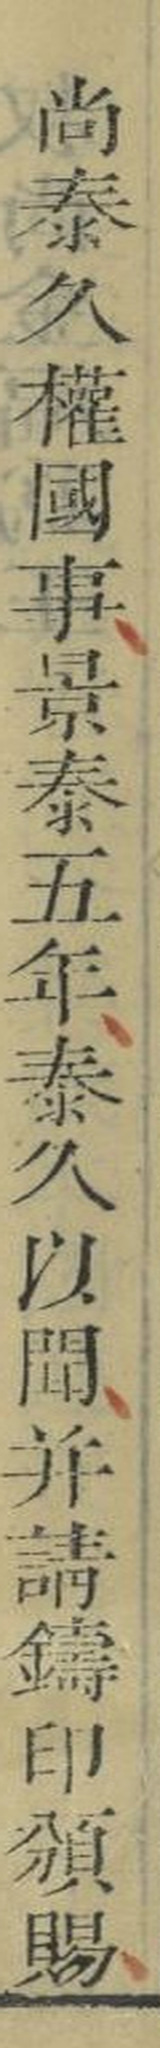尚泰久権国事景泰五年泰久以聞并請鋳印頒賜
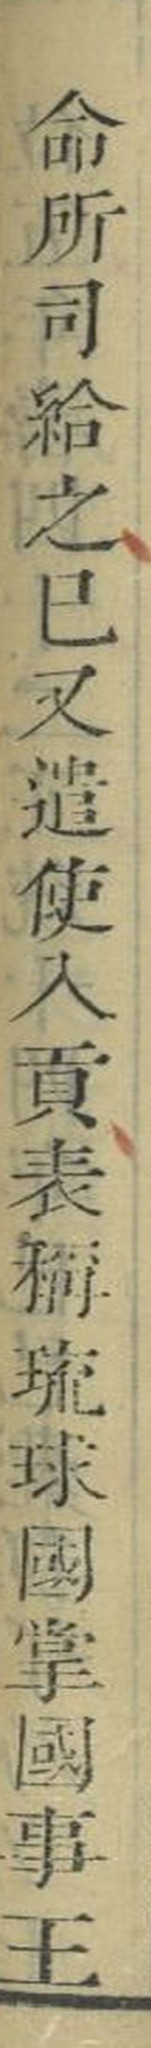命所司給之巳又遣使入貢表称琉球国掌国事王
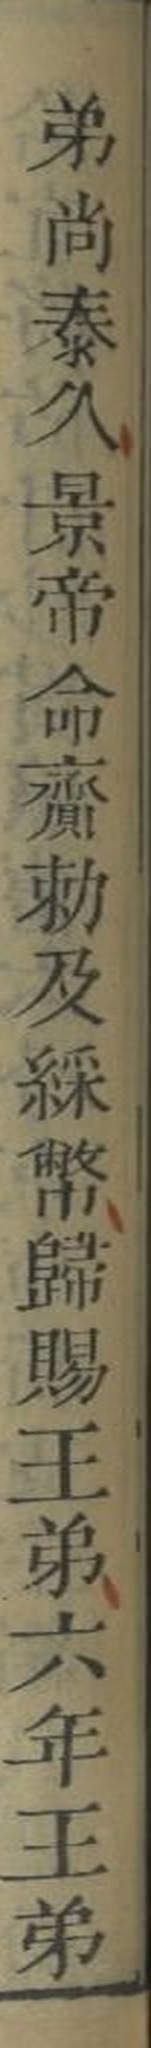弟尚泰久景帝命齎勅及綵幣帰賜王弟六年王弟
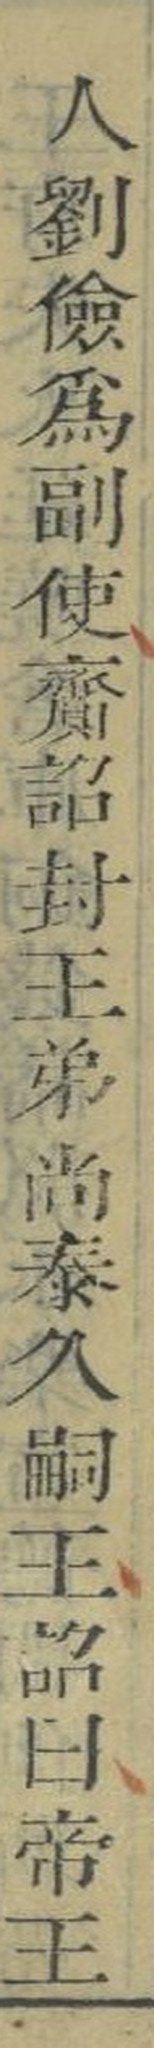人劉倹為副使齎詔封王弟尚泰久嗣王詔曰帝王
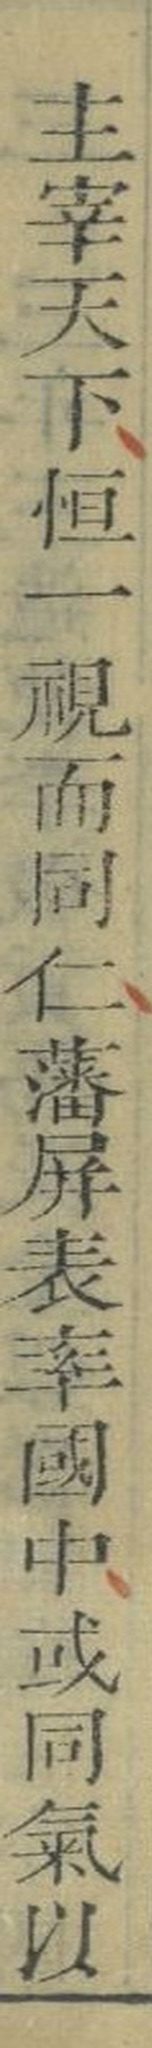主宰天下恒一視而同仁藩屏表率国中或同気以
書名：中山伝信録 巻三
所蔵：University of the Ryukyus Library
